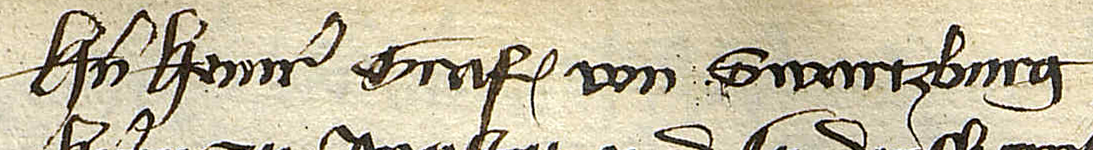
H*n heinr* Graf* on Swarcʒburg
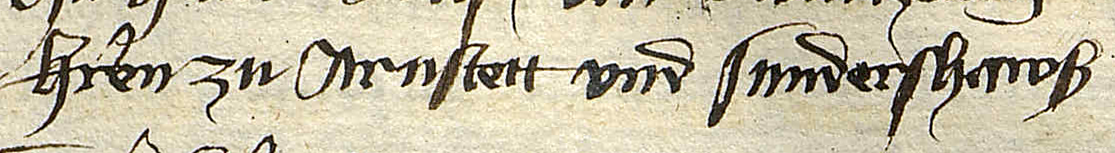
H*ren ʒu Arnſtett vnd ſunderſhawſ*
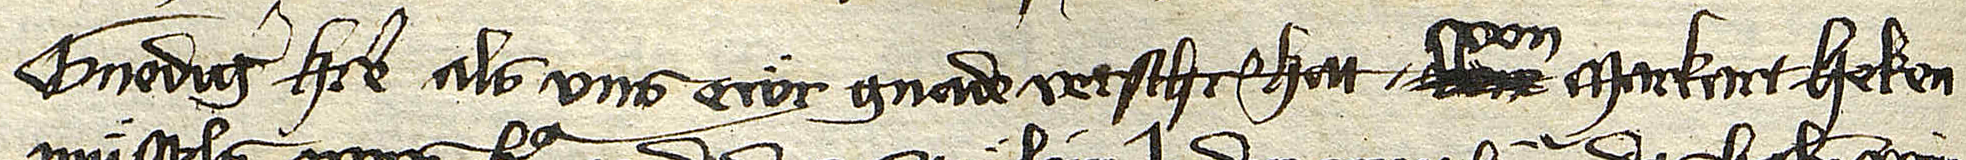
Gnedig* h*re als vns ewr gnade verſchr* hat von Markart heken
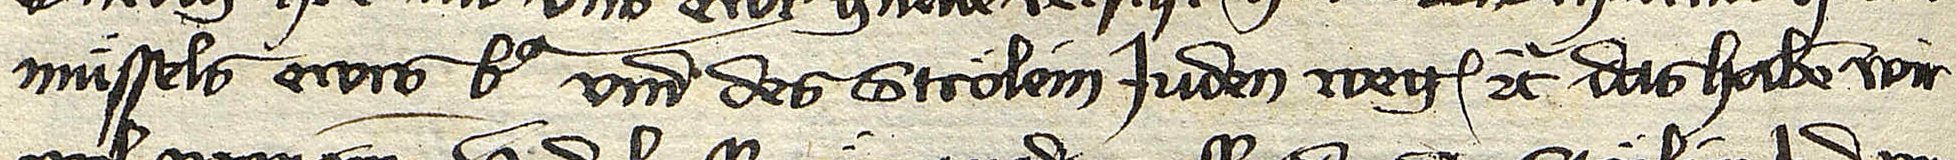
müſſels ewrs b* vnd des Strölein Iuden weg* ec* das habe* wir
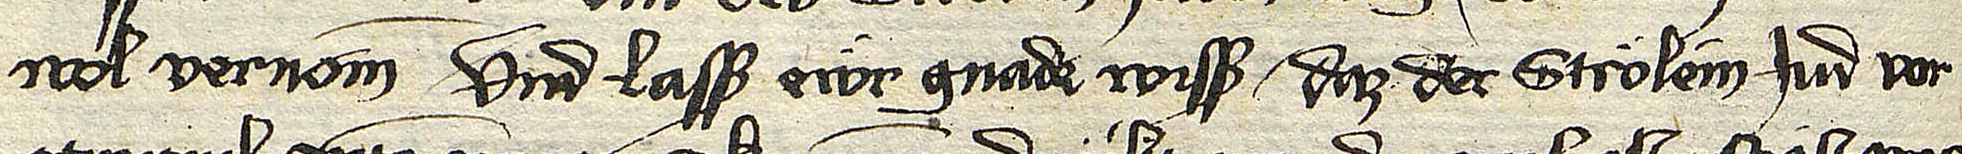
wol vernom* / Vnd laſſ* ewr gnade wiſſ* / daʒ der Strölein Iud vor
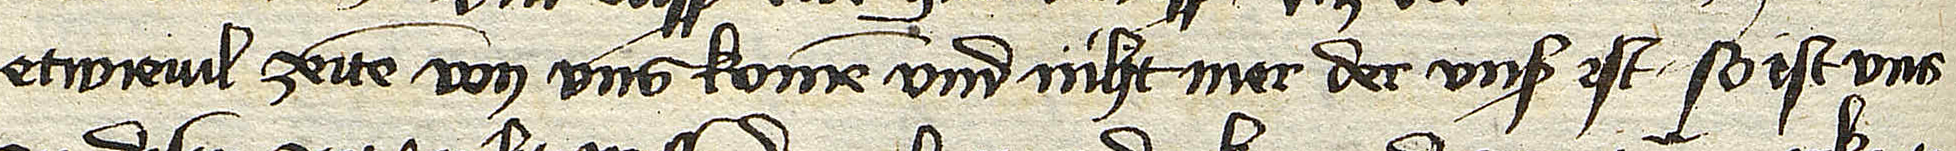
etwieuil ʒeite* von vns kome* vnd niht mer der vnſ* iſt / ſo iſt vns
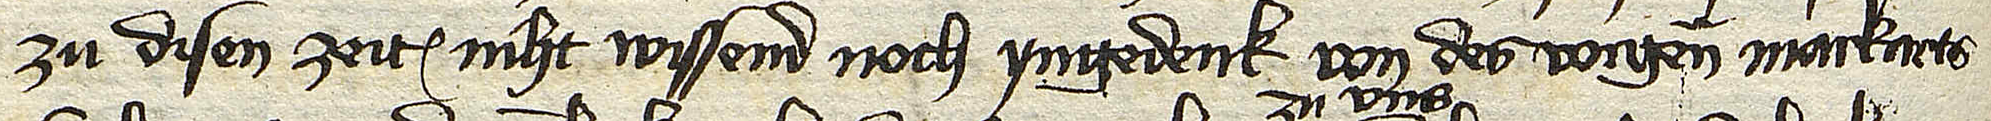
ʒu diſen ʒeit* niht wiſſend noch yngedenk von des vorgen* markarts
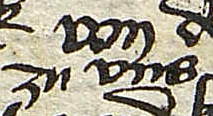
ʒu vns
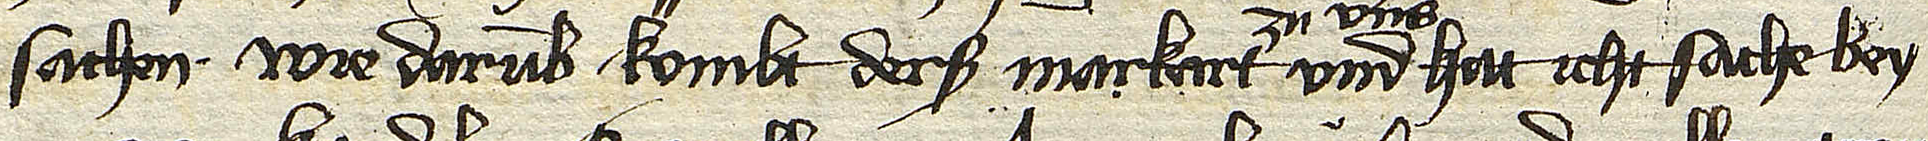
ſachen . wie daru*b kombt derſ* markart vnd hat icht ſache bey
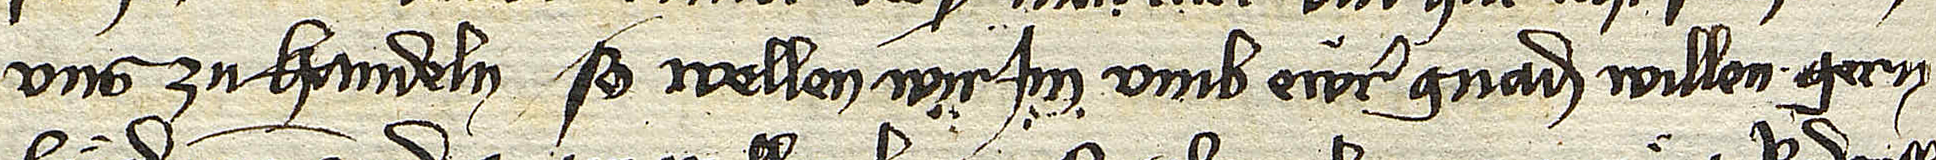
vns ʒu handeln / ſo wellen wir Im vmb ew*r gnad* willen . gern
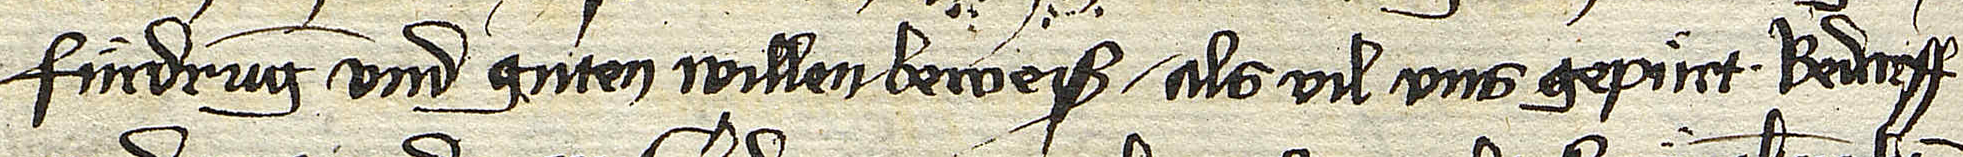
fürdru*g vnd guten willen beweiſ* / als vil vns gepürt . Bedarff
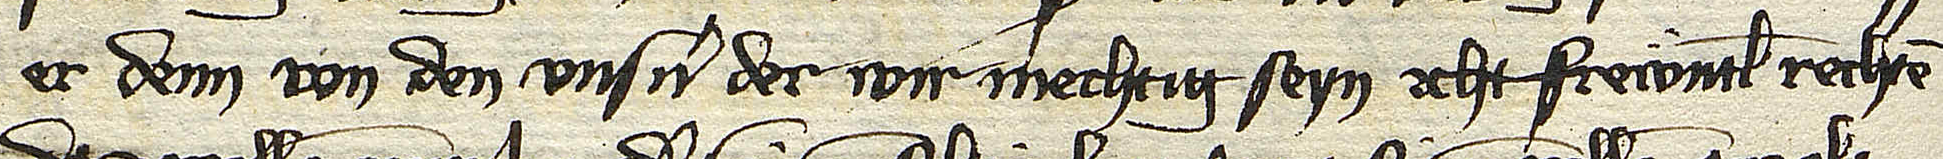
er denn von den vnſ*n der wir mechtig ſeyn icht frewntl* rechte*
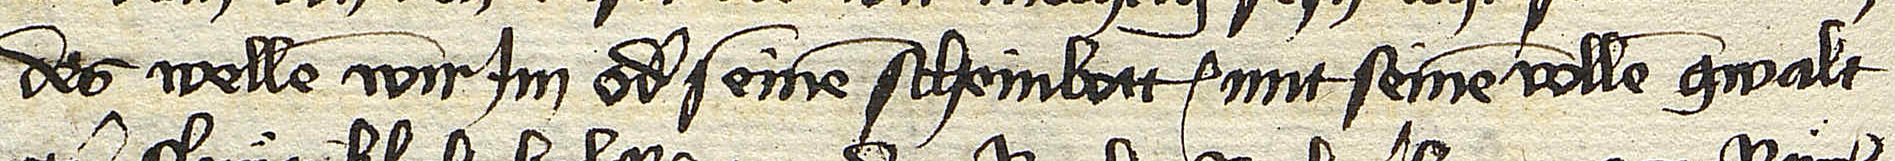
des welle* wir Im od* ſeine* ſcheinbott* mit ſeine* volle* gwalt
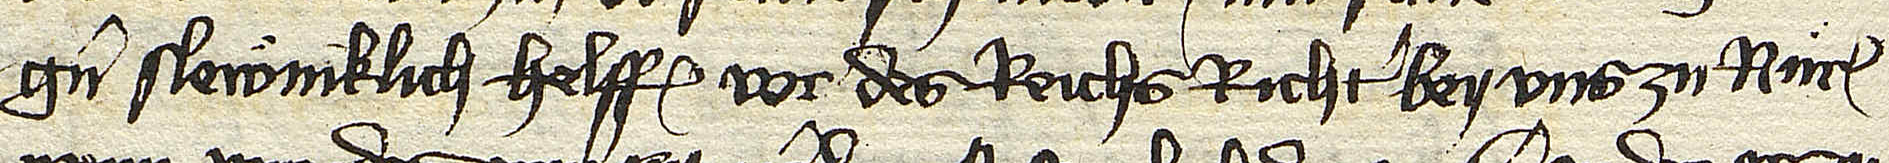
g*n ſlewniklich helff* vor des Reichs Richt* bey vns ʒu Nür*
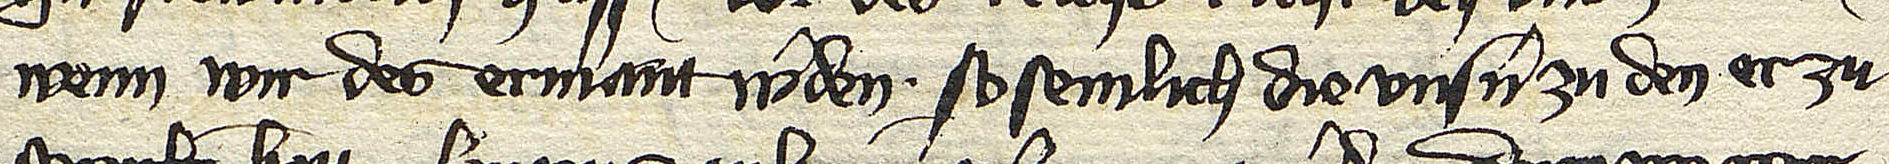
wenn wir des ermant w*den . ſo ſemlich die vnſ*n ʒu den er ʒu
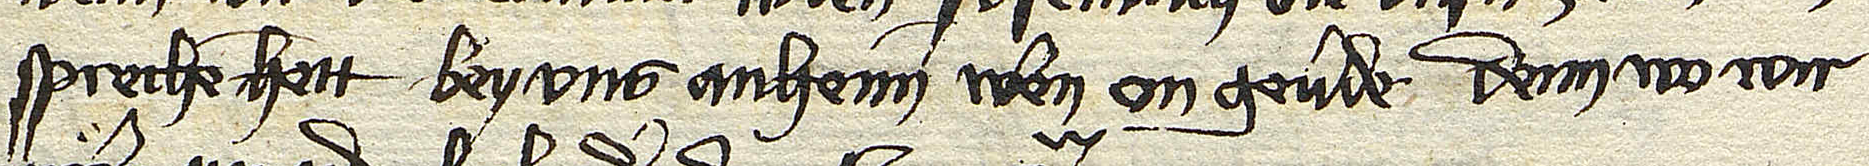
ſpreche* hett / bey vns anheim w*en on geu*de . Denn wo wir
